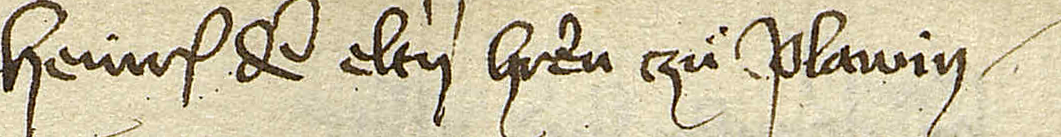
Heinr* d* eltn* hr*en cʒü Plawin / .
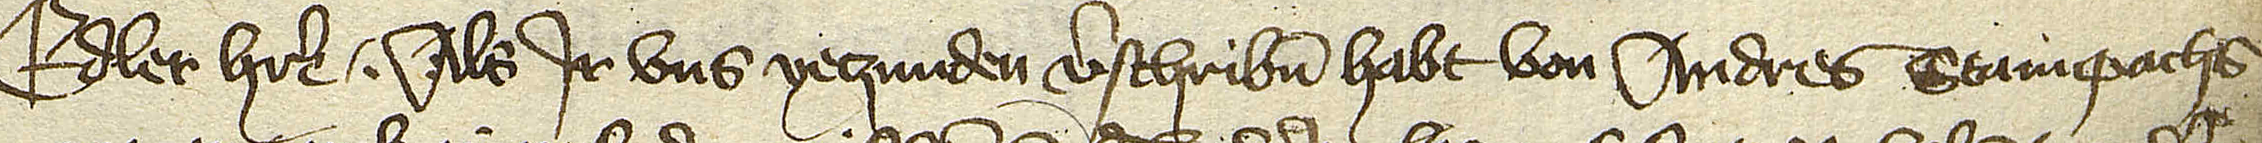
Edler hr*e / . Als Ir vns yecʒunden v*ſchribn* habt von Andres Stainpachs
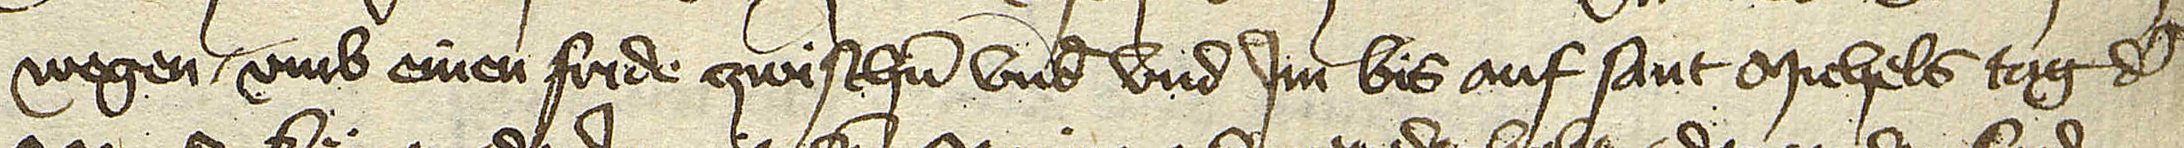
wegen / vmb einen fride cʒwiſchn* vns vnd Im bis auf ſant Michels tag d*
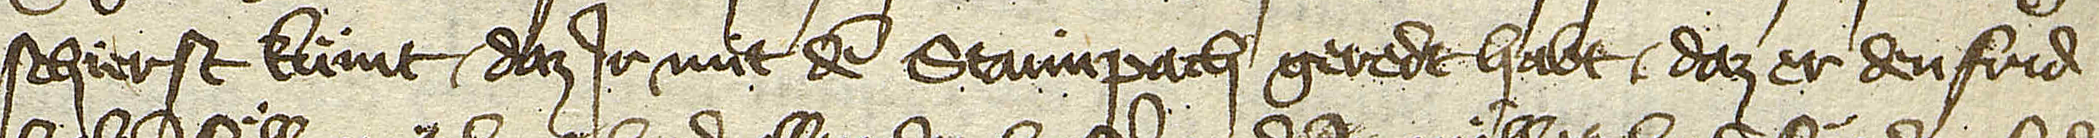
ſchierſt kümt / daʒ Ir mit d* Stainpach geredt habt / daʒ er den frid
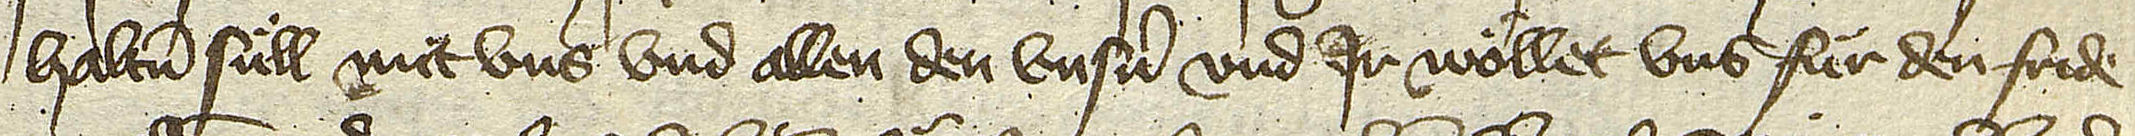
haltn* ſüll mit vns vnd allen den vnſn* vnd Ir wöllet vns für den fride
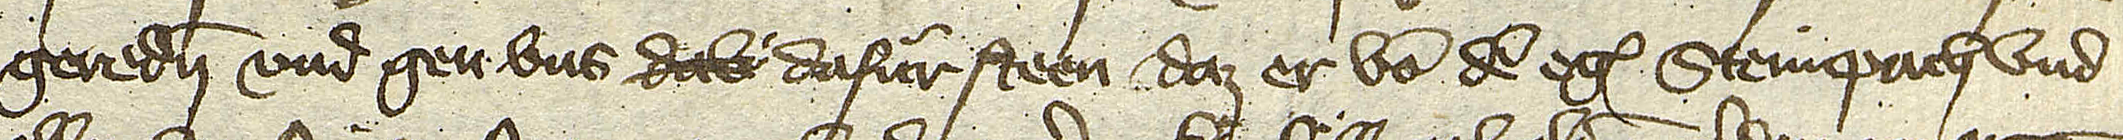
geredn* vnd gen vns dav dafür ſteen / daʒ er vo* d* eg* Steinpach vnd
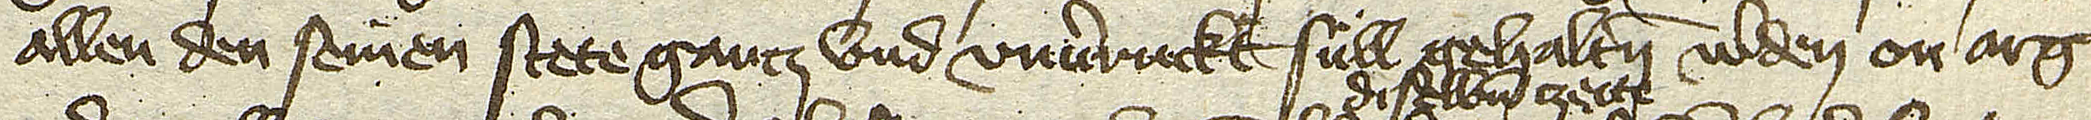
allen den ſeinen ſtete gancʒ vnd vnu*ruckt ſüll gehaltn* w*den on arg
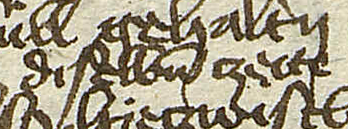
diſelbn* cʒeite
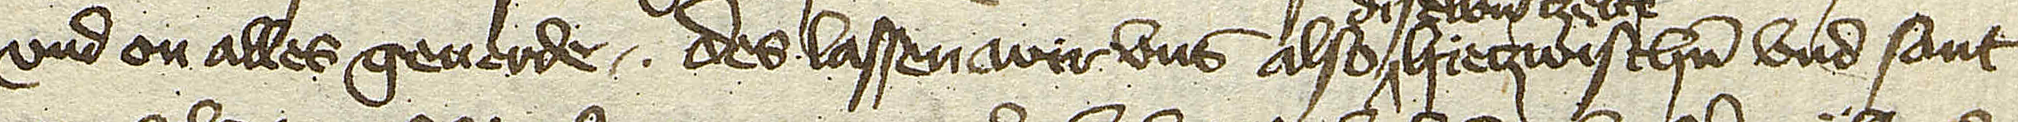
vnd on alles geuerde / . Des laſſen wir vns alſo hiecʒwiſchn* vnd ſant
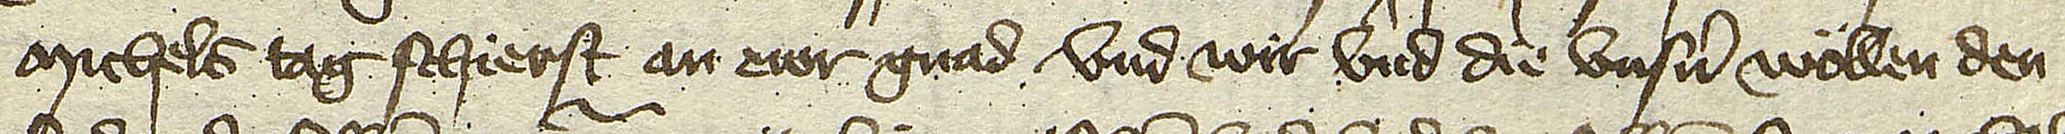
Michels tag ſchierſt an ewr gnad / vnd wir vnd die vnſn* wöllen den
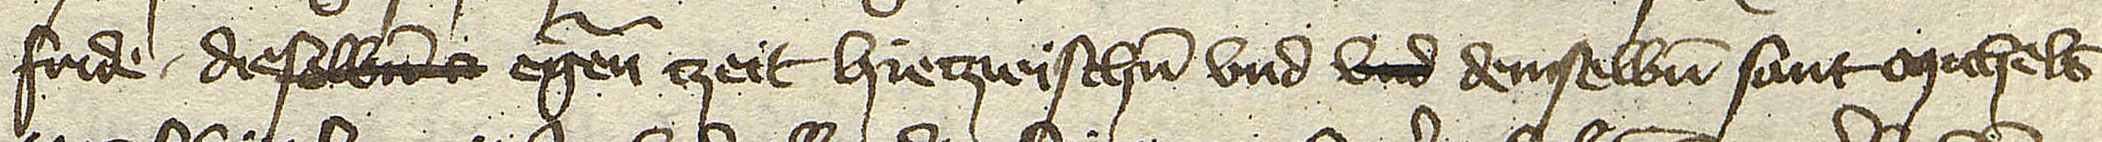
fride / dieſelbn* % egen* cʒeit hiecʒwiſchn* vnd vnd demſelbn* ſant Michels
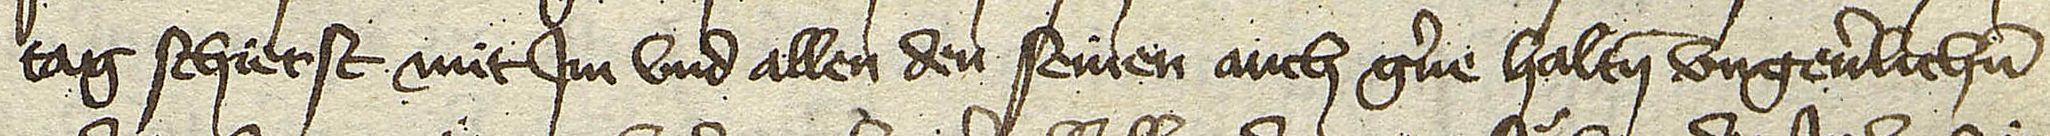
tag ſchierſt mit Im vnd allen den ſeinen auch g*ne haltn* vngeu*lichn*
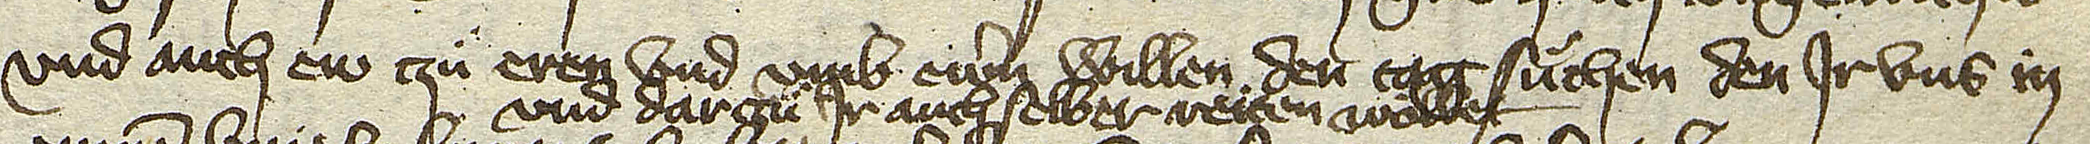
vnd auch ew cʒü eren vnd vmb ew*n willen den tag ſüchen den Ir vns in
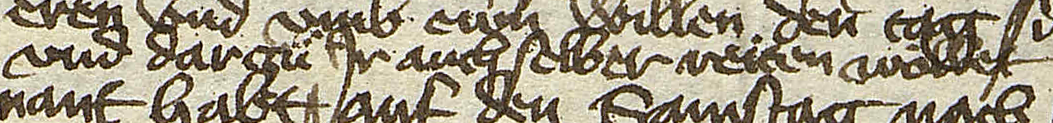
vnd darcʒü Ir auch ſelber reiten wöllet
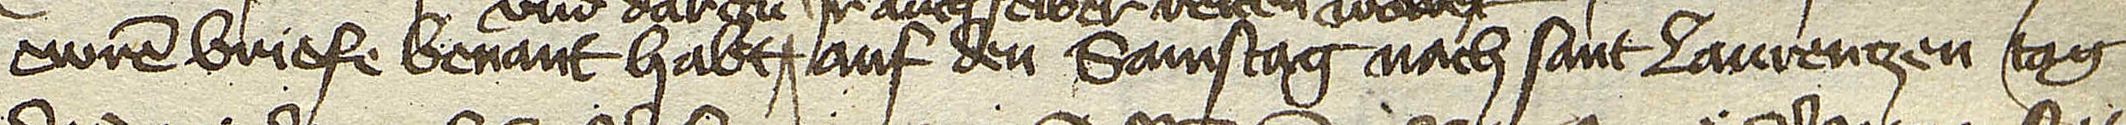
ewre* briefe benant habt / auf den Samſtag nach ſant Laurencʒen tag
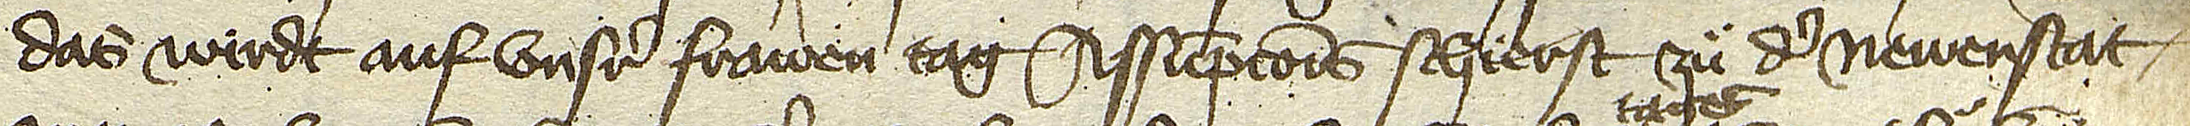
das wirdt auf vnſr* frawen tag Aſſu*pcois* ſchierſt cʒü d* Newenſtat /
